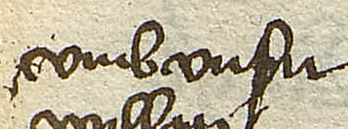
vmb vnſ*n
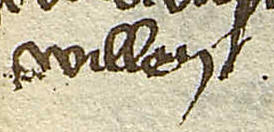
willen
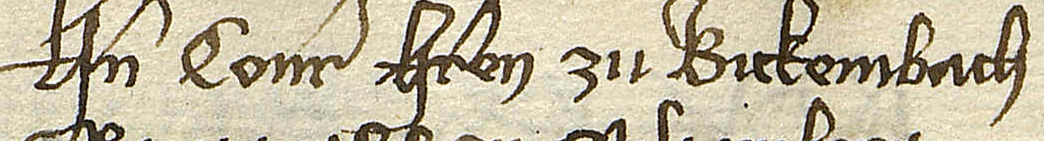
Hn* Conr* h*ren ʒu Bickembach
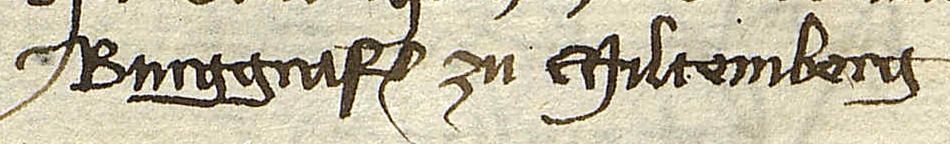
Burggraf* ʒu Miltemberg
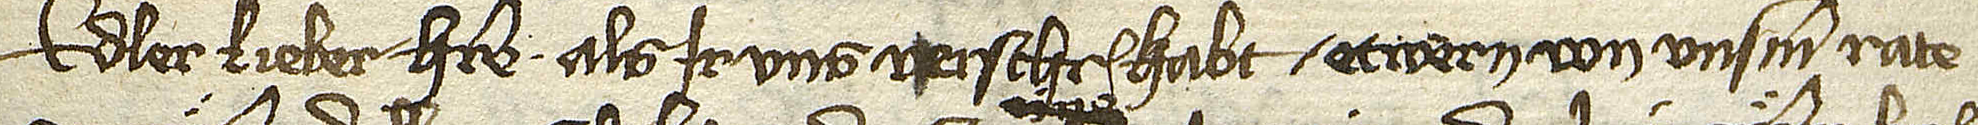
Edler lieber h*re . als Ir vns verſchr* habt / etwern von vnſ*m rate
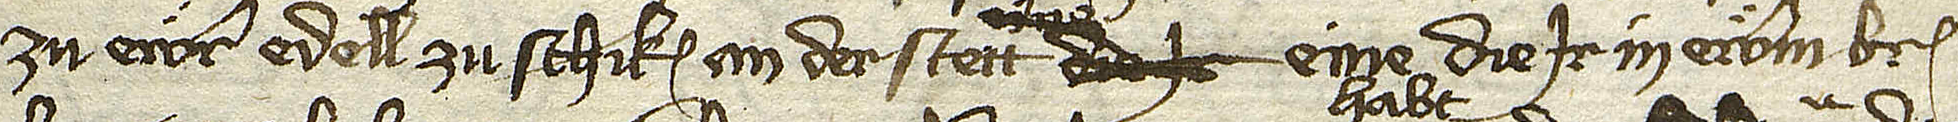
ʒu eẅr* edell ʒu ſchik* an der ſtett die Ir eine die Ir in eẅ*m br*
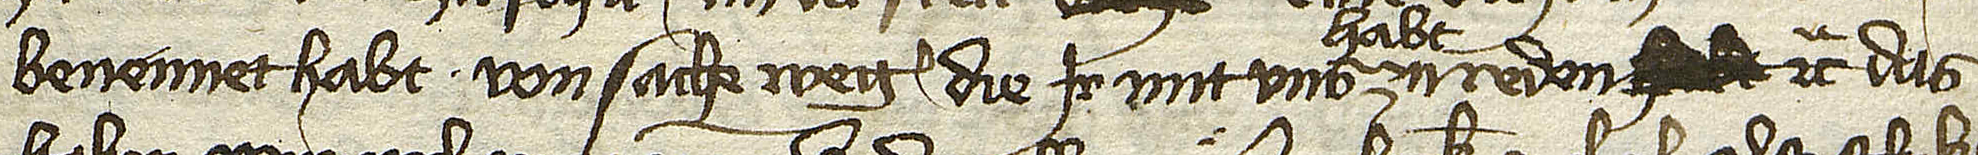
benennet habt . von ſache weg* die Ir mit vnſ*n reden habt ec* das
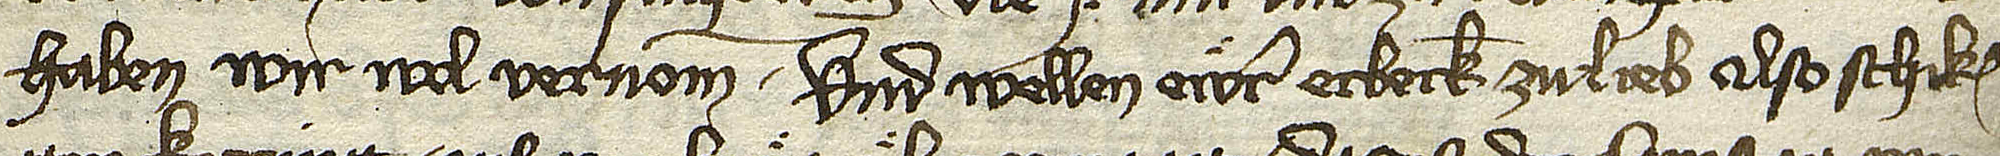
haben wir wol vernom* / Vnd wellen eẅr* erberk* ʒu lieb alſo ſchik*
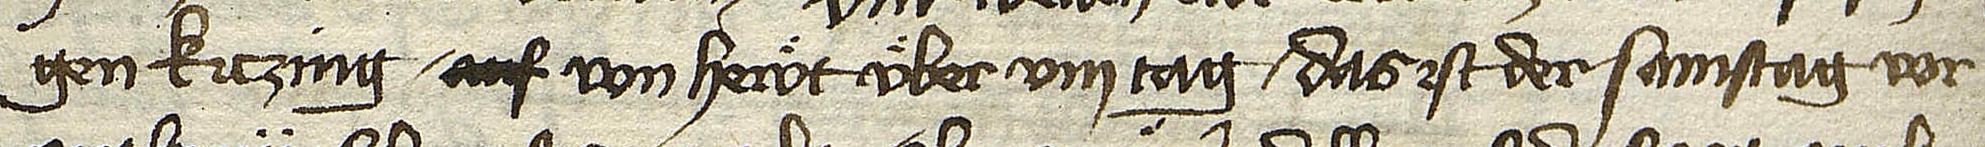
gen kicʒing / auf von heẅt v̈ber viii tag / das iſt der ſamſtag vor
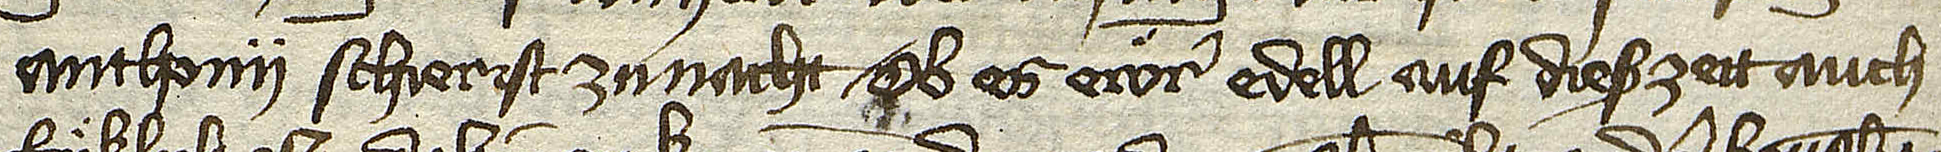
anthonii ſchieriſt ʒu nacht / Ob es eẅr edell auf dieſ* ʒeit auch
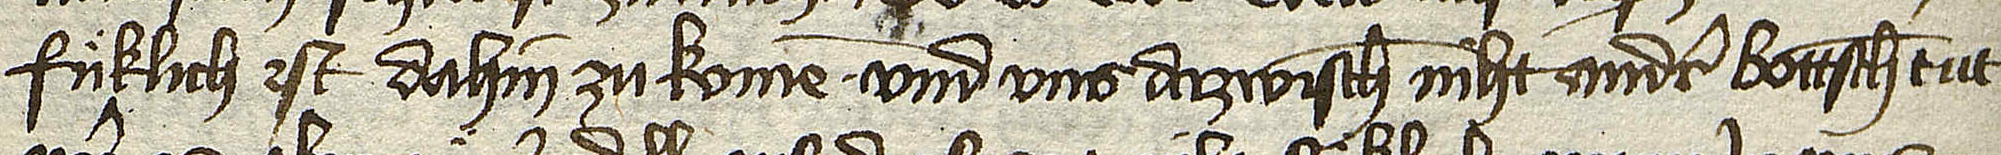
füklich iſt dahin ʒu kome* . vnd vns daʒwiſch* niht and*r bottſch* tut
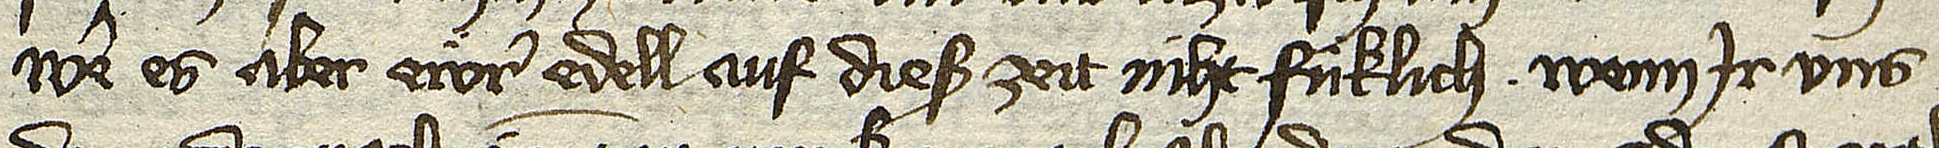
we* es aber eẅr* edell auf dieſ* ʒeit niht füklich . wenn Ir vns
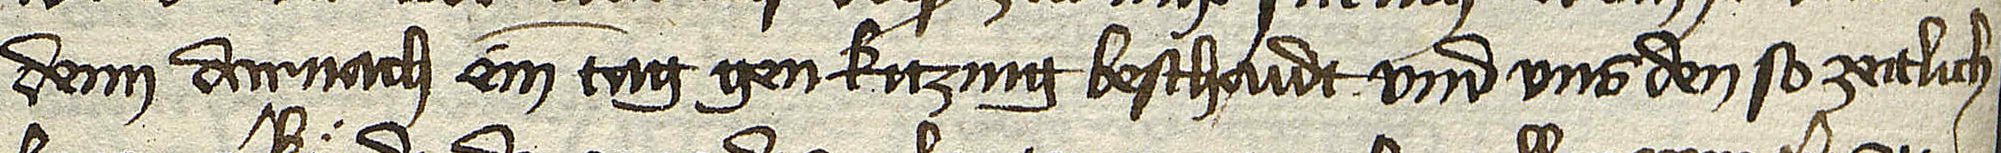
denn darnach ein* tag gen kicʒing beſchaidt . vnd vns den ſo ʒeitlich
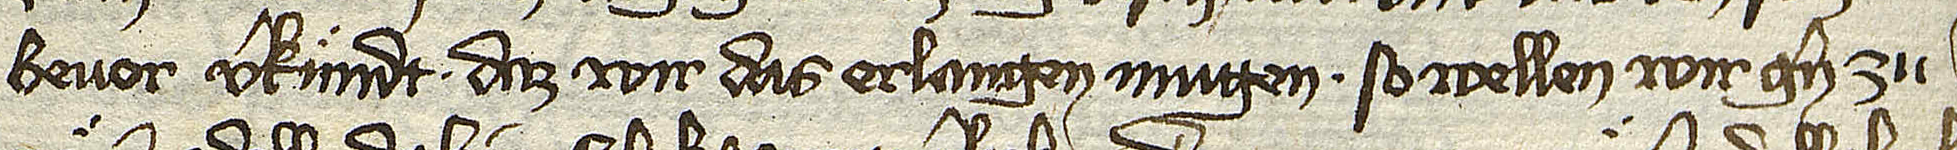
beuor v*kündt . daʒ wir das erlangen mugen . ſo wellen wir g*n ʒu
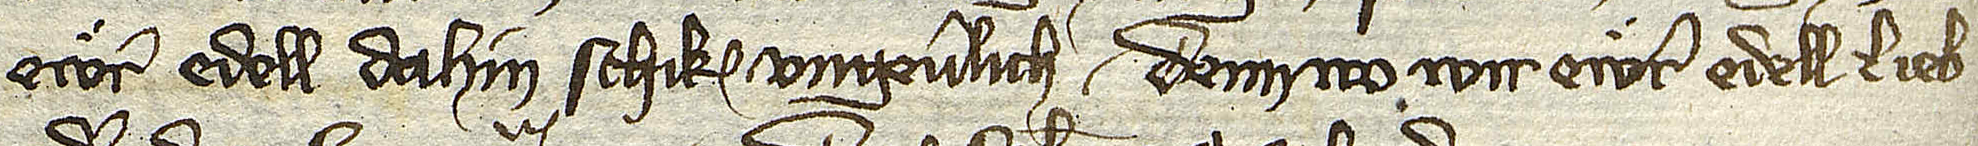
eẅr* edell dahin ſchik* vngeu*lich / Denn wo wir eẅr* edell lieb
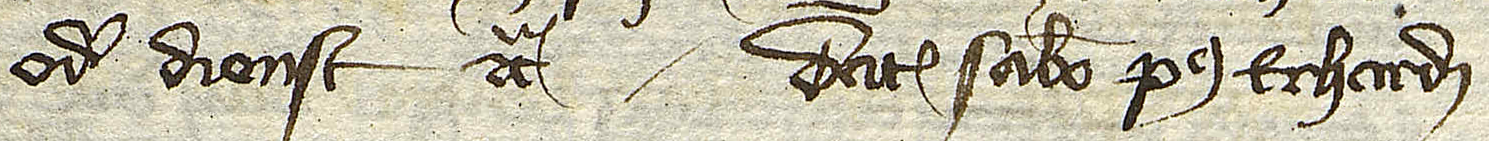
od* dienſt ec* / Dat* ſabo* p* Erhardi
